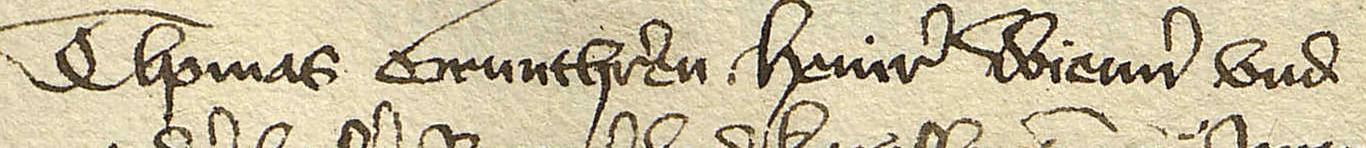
Thomas Grunthr*en / heinr* Wienn* vnd
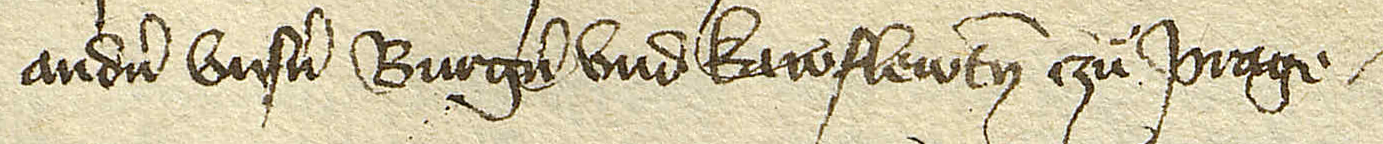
andn* vnſn* Burgn* vnd kauwflewtn* cʒü Prage /
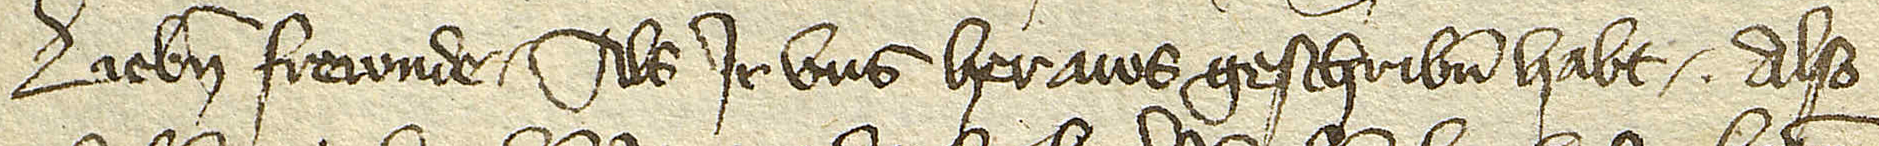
Liebn* frewnde / Als Ir vns heraws geſchribn* habt / . Alſo
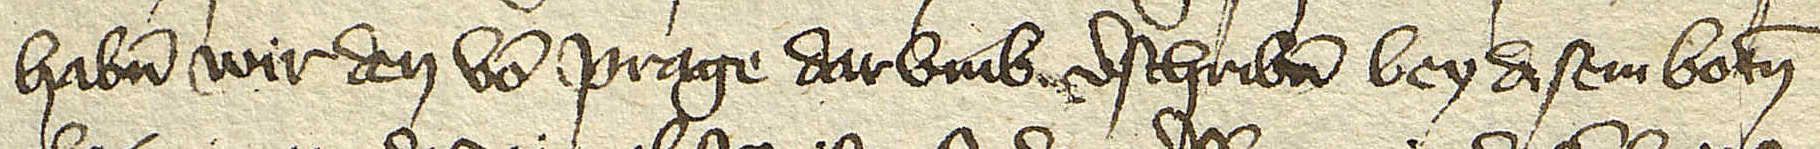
habn* wir den vo* Prage darvmb v*ſchribn* bey diſem botn*
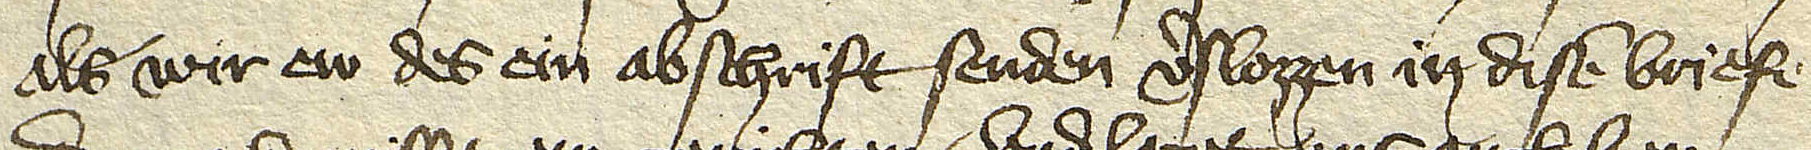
als wir ew des ein abſchrift ſenden v*ſloʒʒen in diſe* briefe
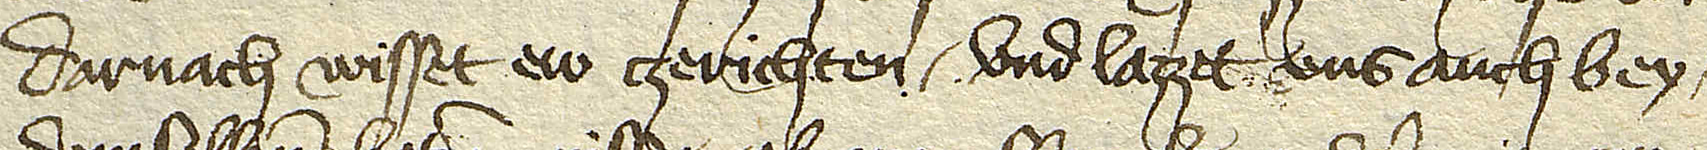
Darnach wiſſet ew cʒerichten / vnd laʒʒet vns auch bey
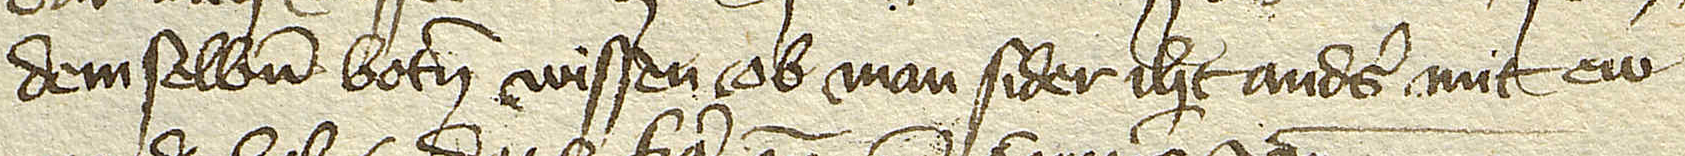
demſelbn* botn* wiſſen / ob man ſider iht ands* mit ew
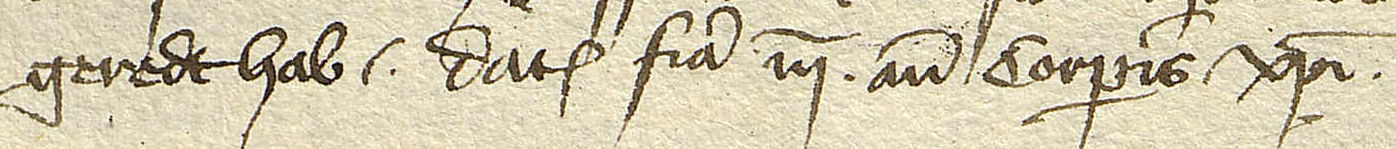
geredet hab / . Dat* fia* iii* an* Corp*is / xpi* .
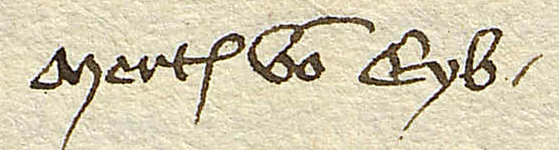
Mert* vo* Eyb /
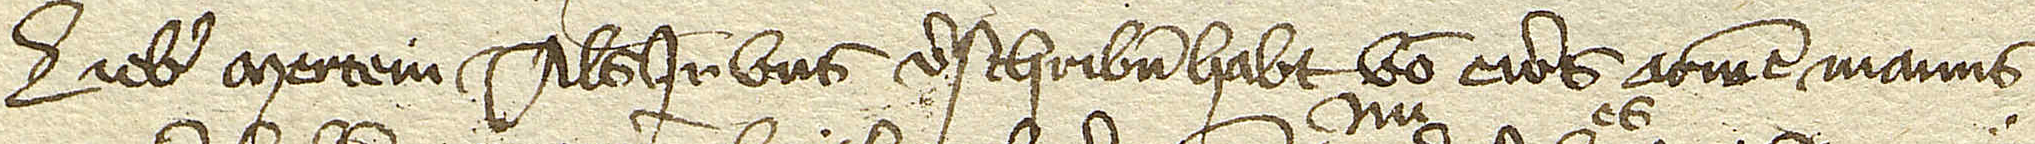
Lieb* Mertein / Als Ir vns v*ſchribn* habt vo* ew*s arme* manns
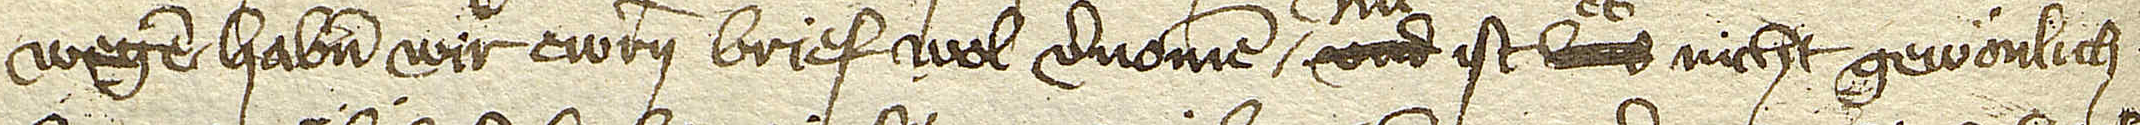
wege* / habn* wir ewrn* brief wol v*nome* / vnd iſt vns nicht gewönlich
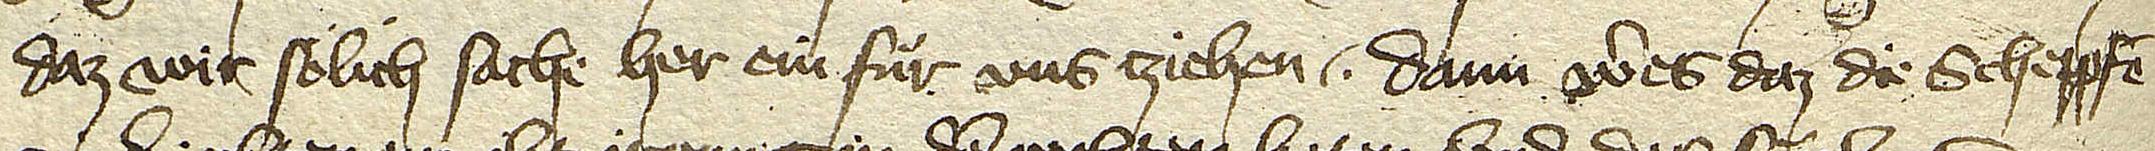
daʒ wir ſölich ſache her ein für vns cʒiehen / . dann w* es daʒ die Scheppfe*
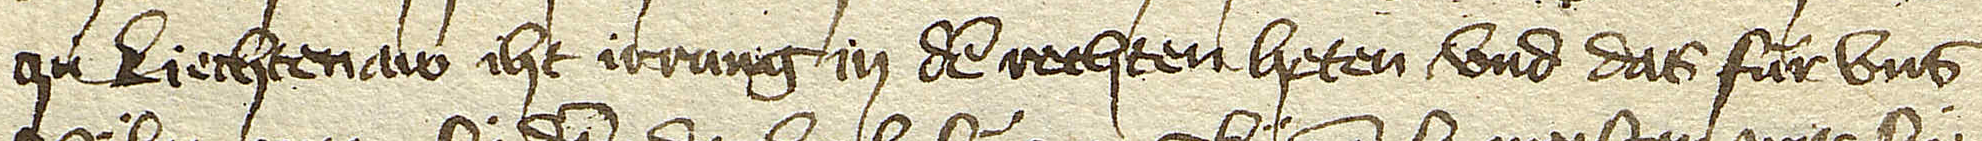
cʒü Liechtenaw iht irrung in d* rechten heten / vnd das für vns
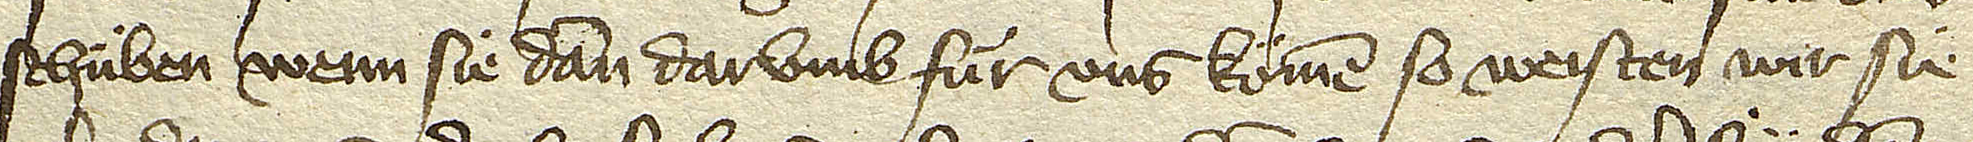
ſchüben wenn ſie dan* darvmb für vns köme* ſo weiſten wir ſie
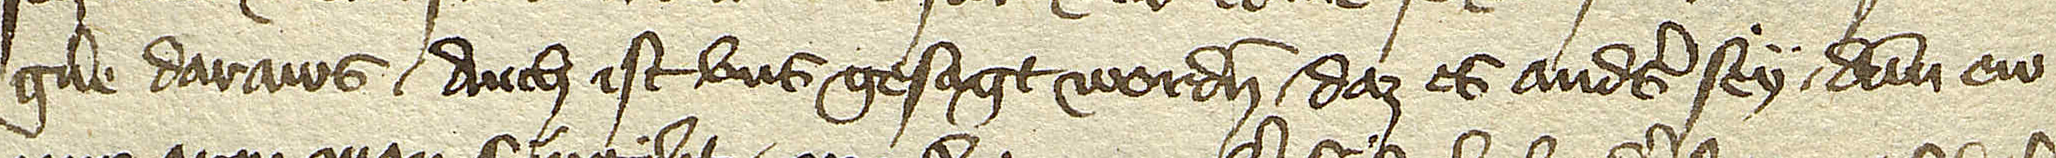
gn*e daraws / Auch iſt vns geſagt wordn* / daʒ es ands* ſey / dan* ew
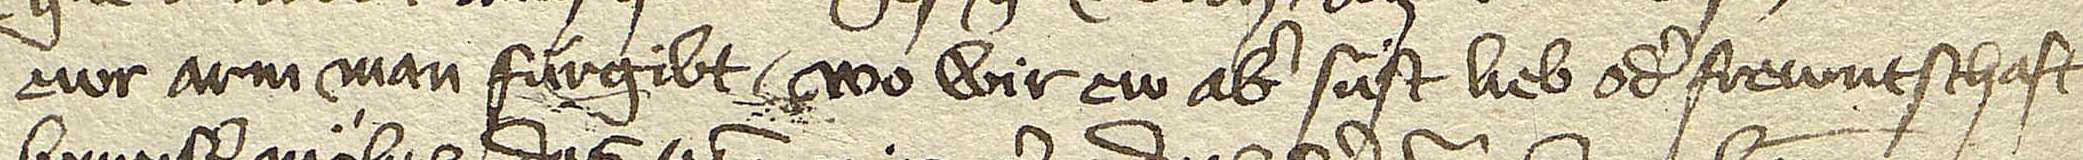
ewr arm man fürgibt / wo wir ew ab* ſüſt lieb od* frewntſchaft
